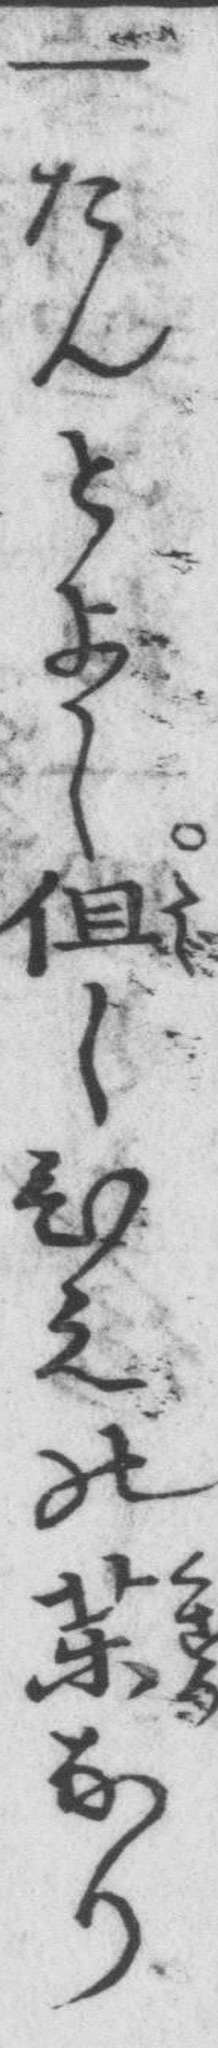一たんとよし。但しひえの薬なり
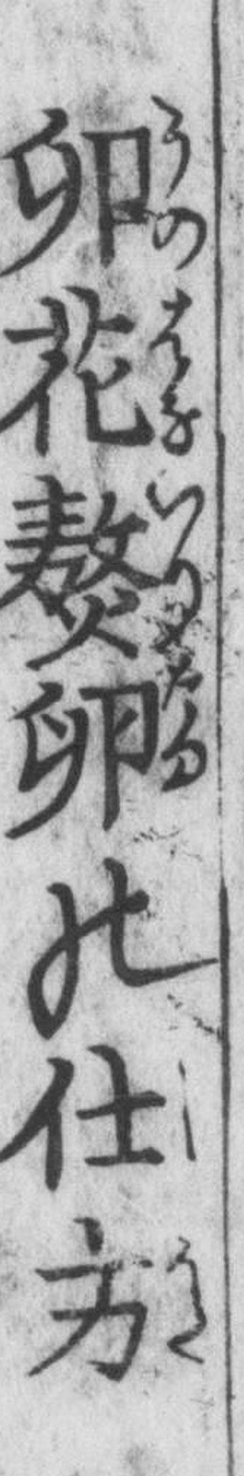卯花熬卵の仕方
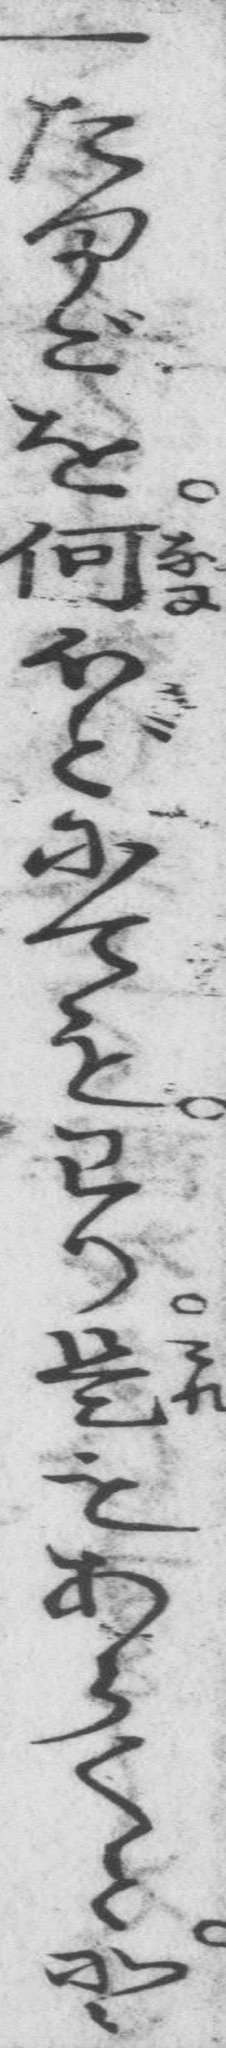一たまごを。何ほどにても。わり。是もあら〳〵と。と
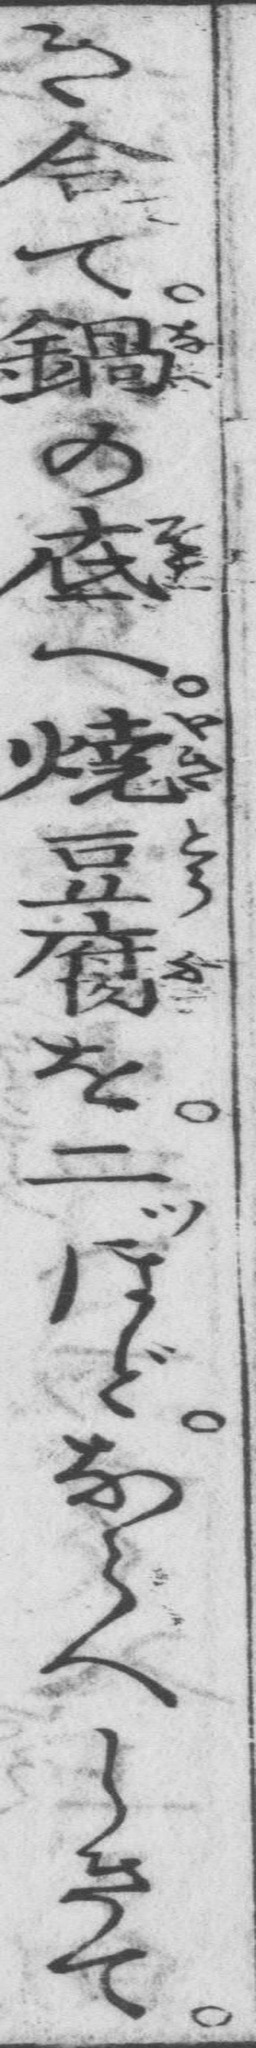き合せて。鍋の底へ。焼豆腐を。二ツほど。ならへしきて。
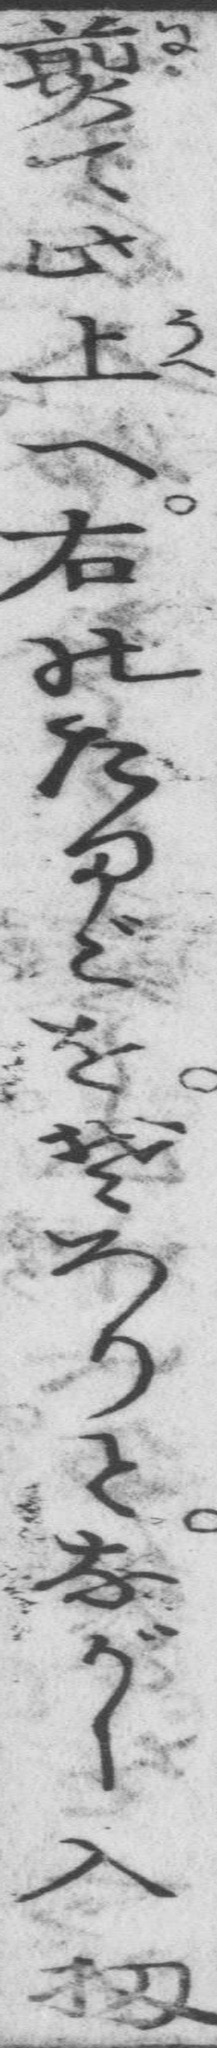煎て此上へ。右のたまごを。そろりと。ながし入扨
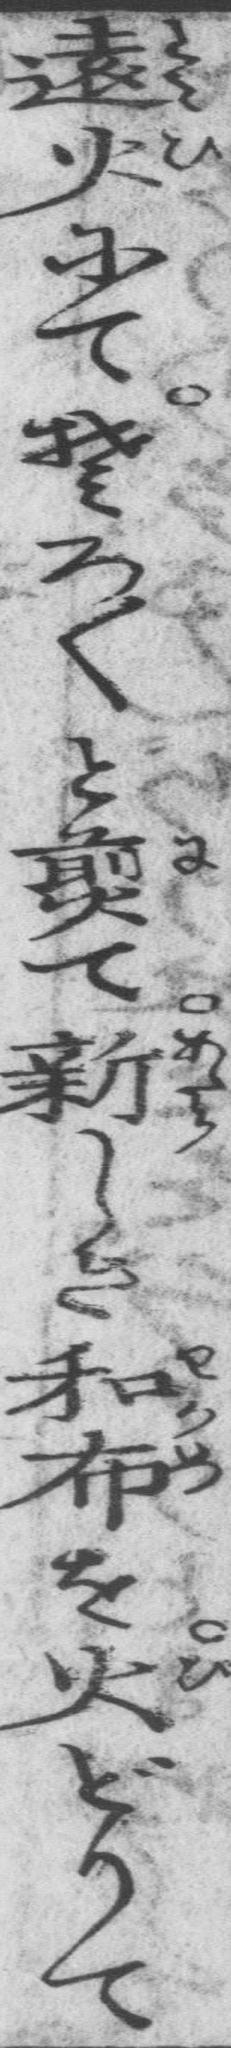遠火にて。そろ〳〵と煎て。新しき和布を。火どりて
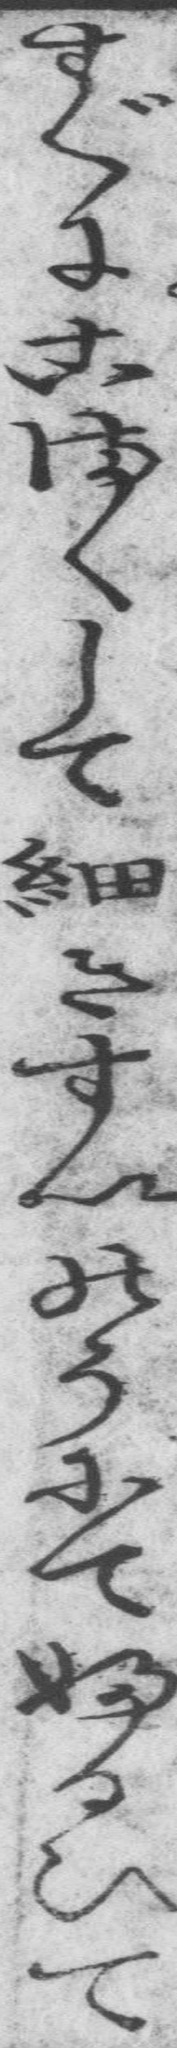すぐに。こま〳〵して。細きすいのうにて。ふるひて
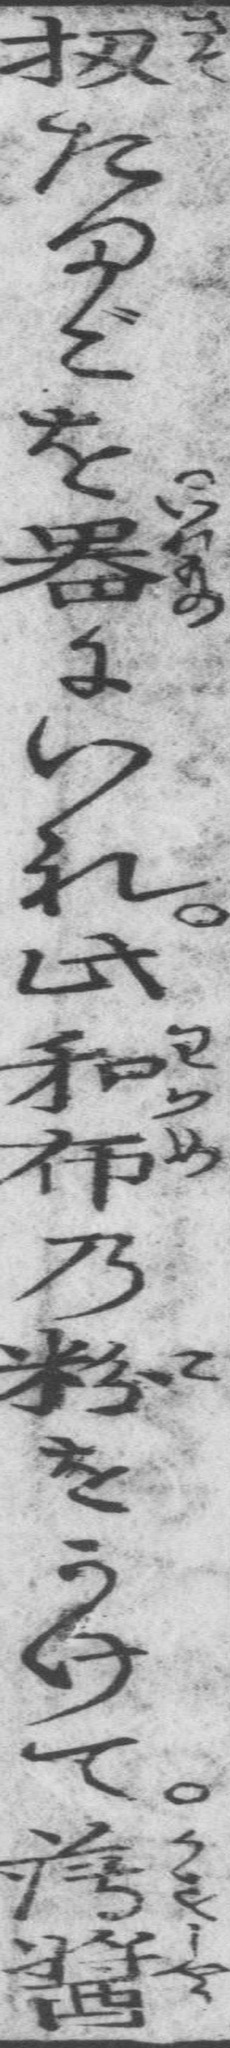扨たまごを。器にいれ。此和布の粉をかけて。薄醤
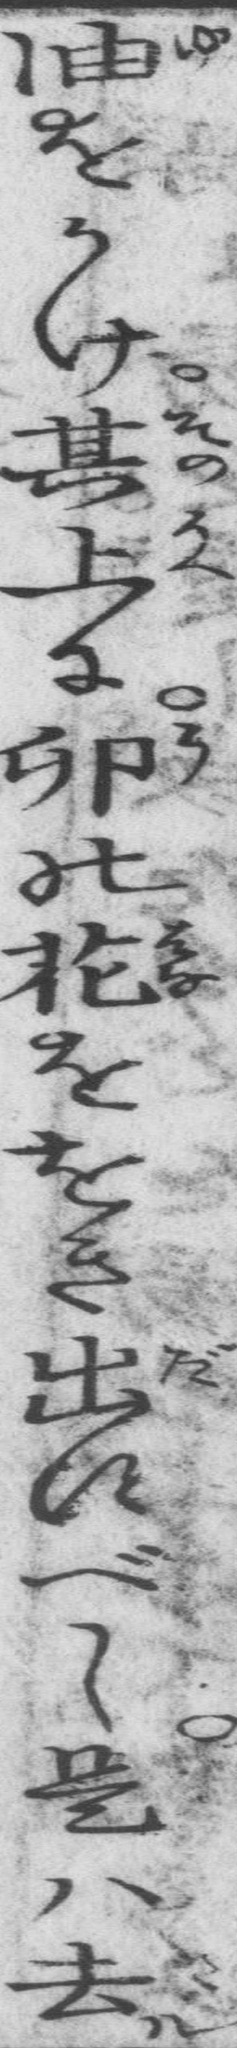油をかけ。其上に。卯の花ををき出すべし。是は去る
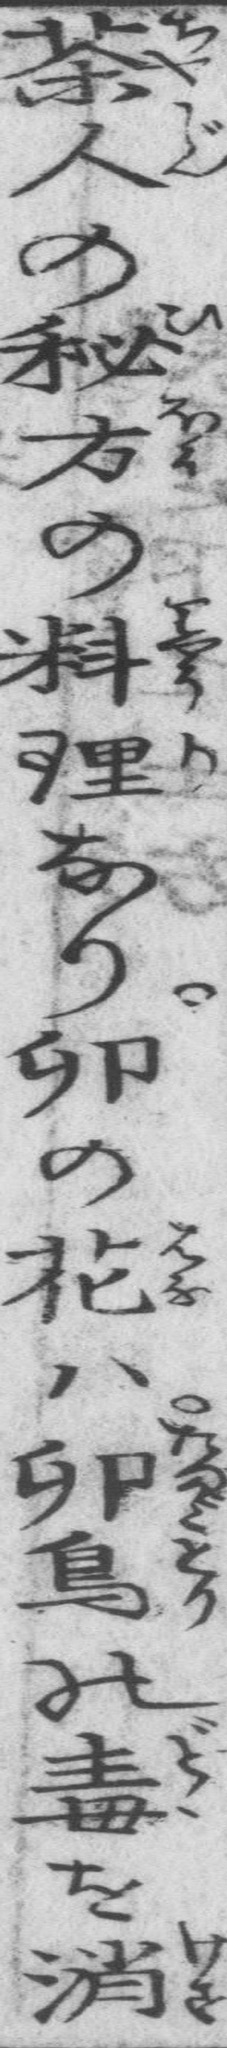茶人の秘方の料理なり。卯の花は。卵鳥の毒を消
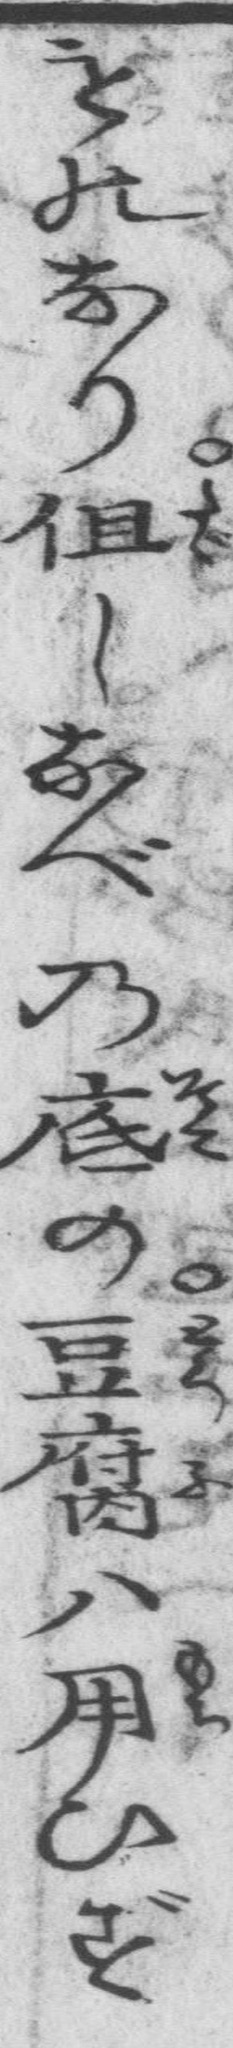ものなり。但しなべの底の。豆腐は用ひず
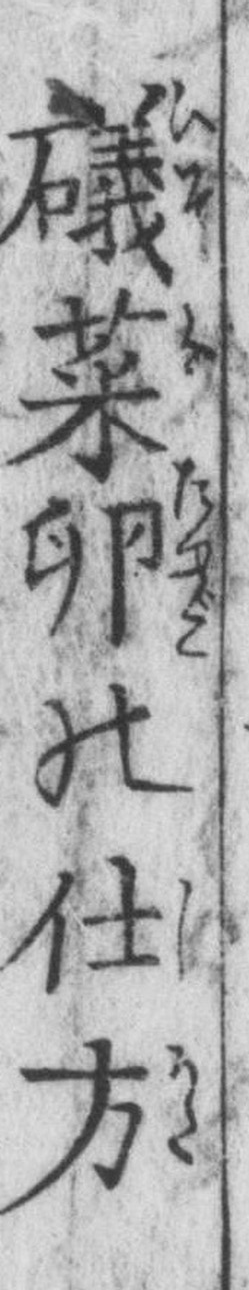磯菜卵の仕方
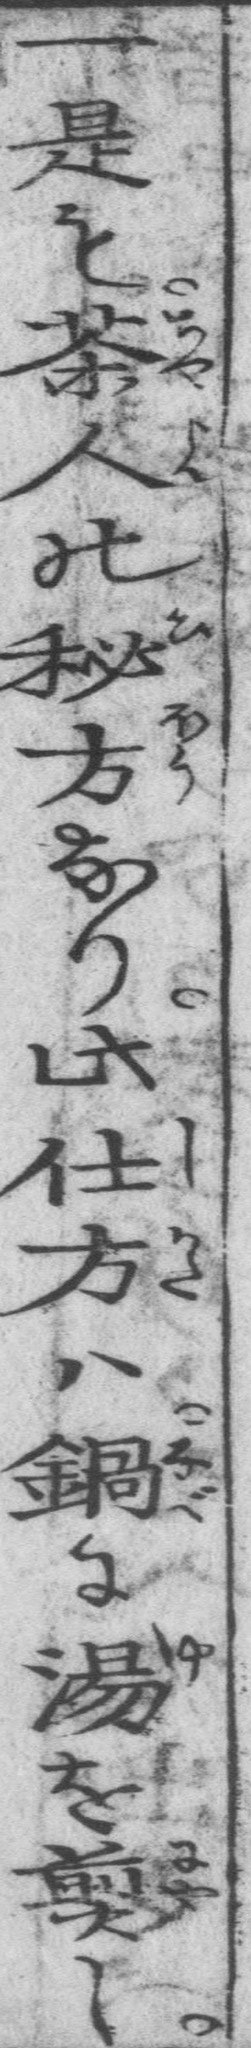一是も。茶人の秘方なり。此仕方は。鍋に湯を煎し。
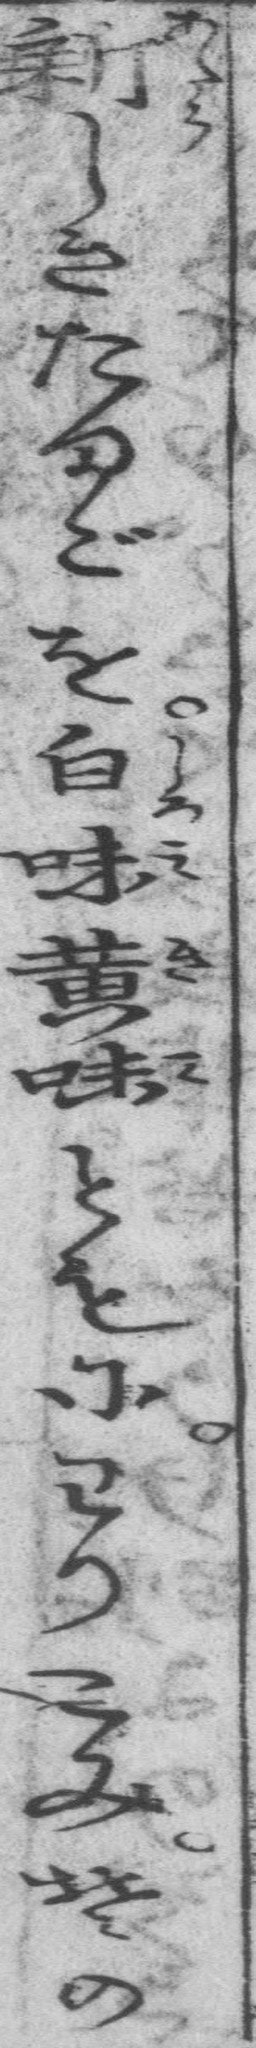新しきたまごを。白味黄味ともに。わりこみ。その

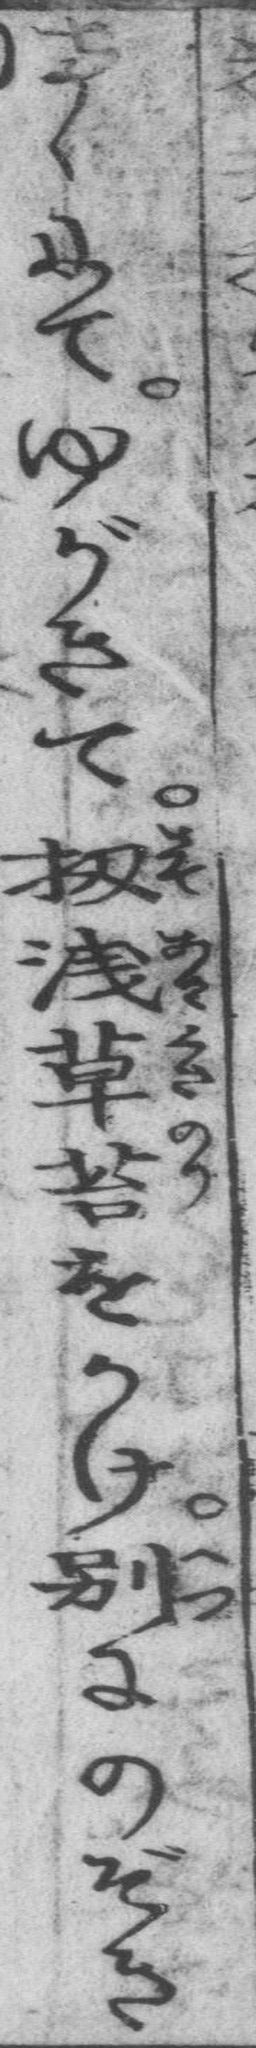まゝにて。ゆがきて。扨浅草苔をかけ。別にのぞき
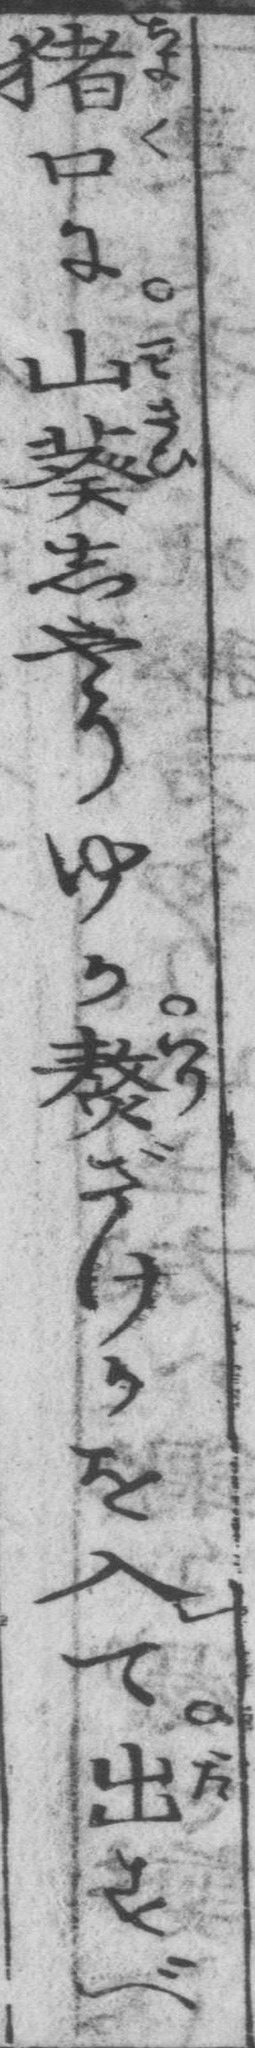猪口に。山葵しやうゆか。熬ざけかを入れて。出すべ
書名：萬寳料理秘密箱
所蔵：大阪府立大学学術情報センター 国文学研究資料館
